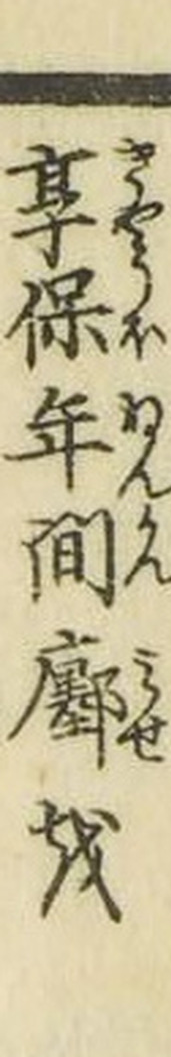享保年間鄽を
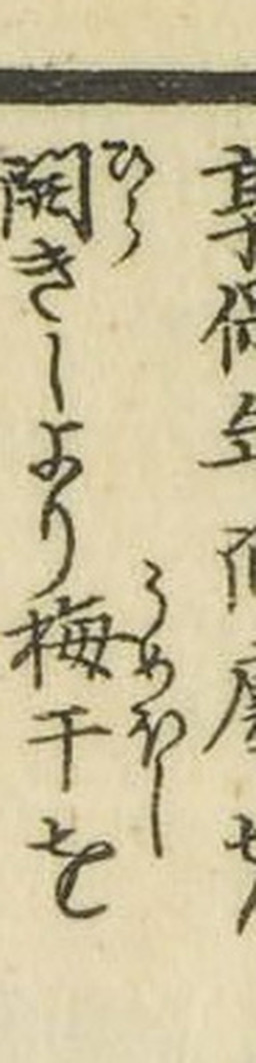開きしより梅干を
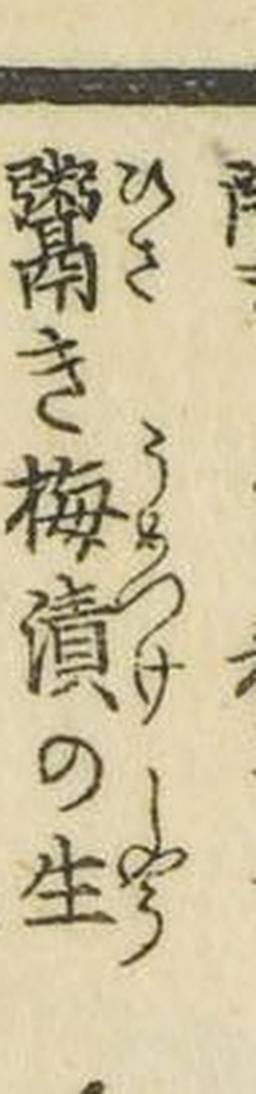鬻き梅漬の生
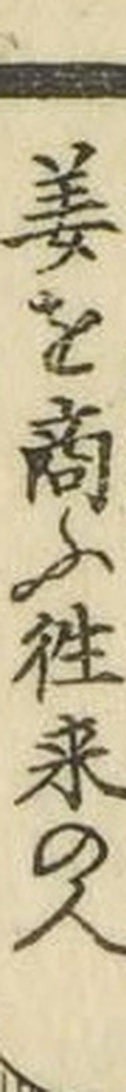姜を商ふ往来の人
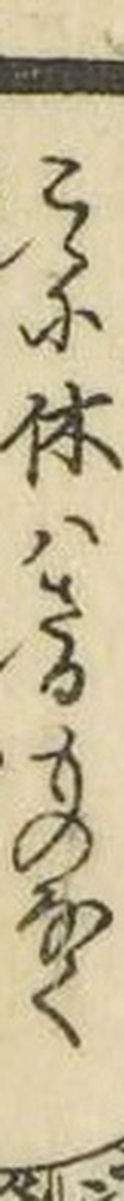こゝに休はさるものなく
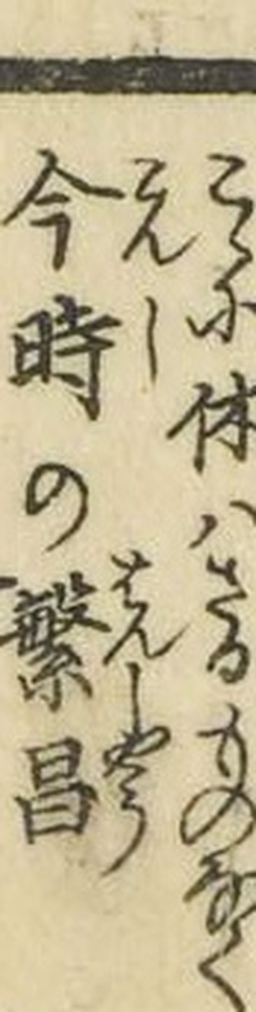今時の繁昌
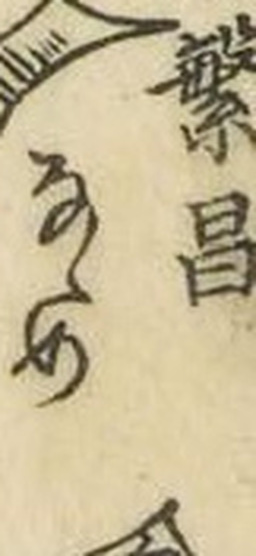なゝめ
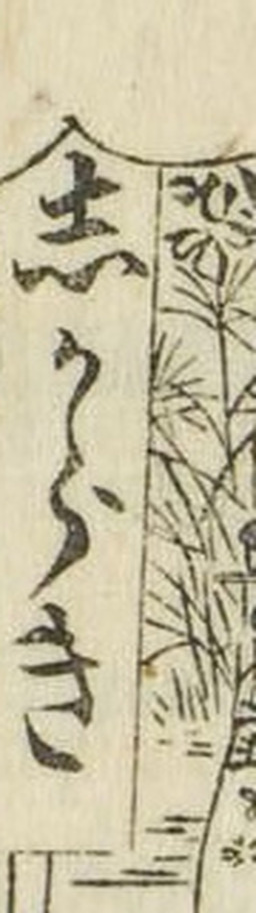しからき

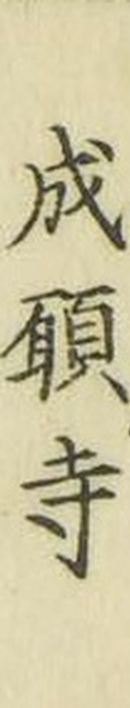成願寺
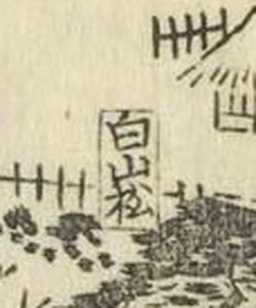白山松

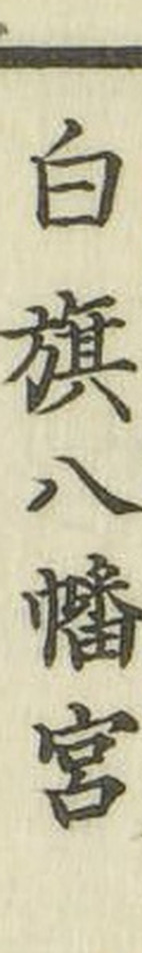白旗八幡宮

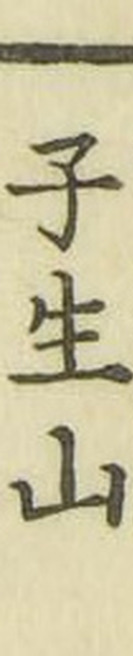子生山
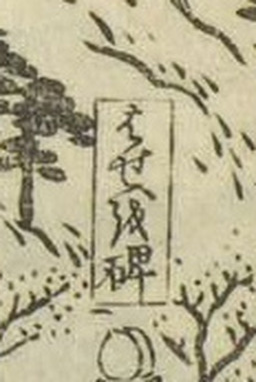はせを碑
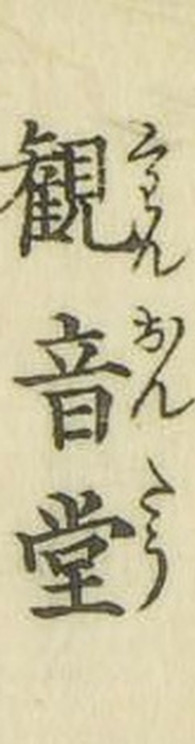観音堂
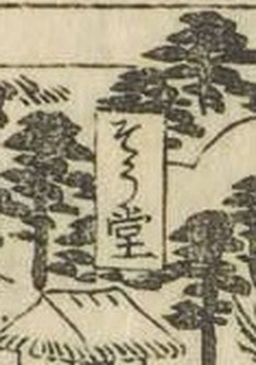そう堂
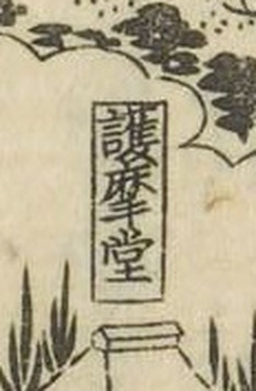護摩堂
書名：江戸名所図会 20巻 巻之5
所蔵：東京学芸大学教育コンテンツアーカイブ
